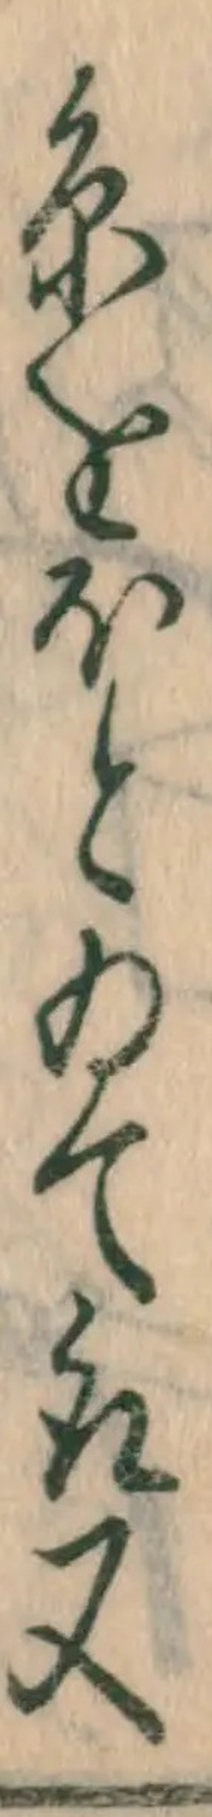糸をほとゐて取又
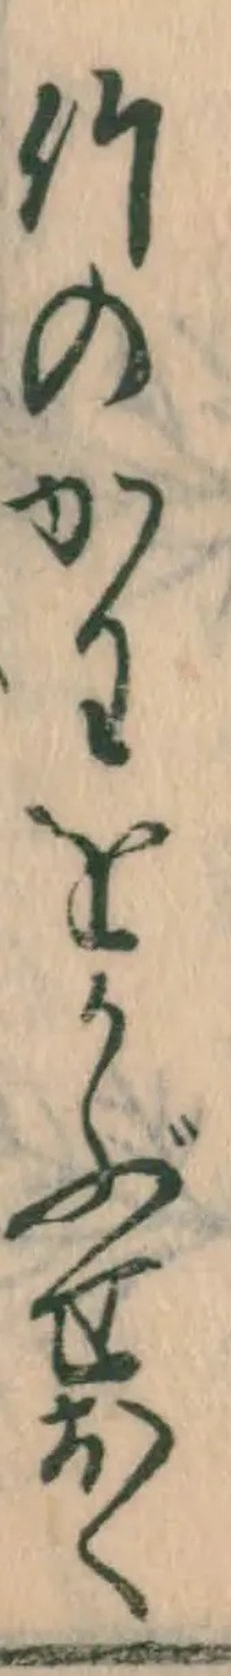竹のかわをかぶせおく
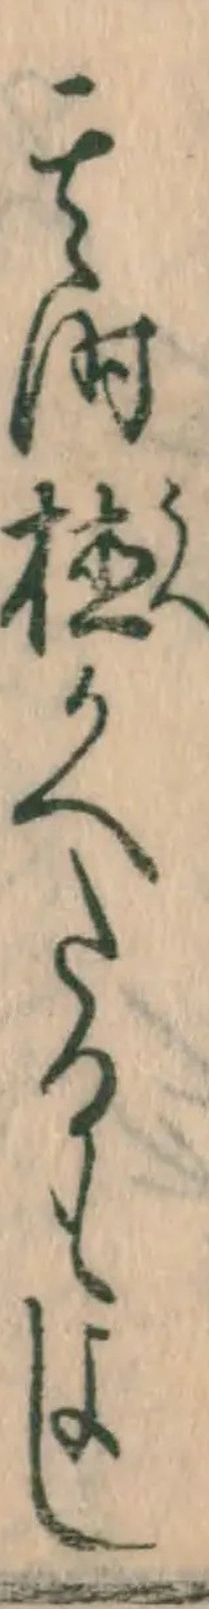其時植かへたるもよし
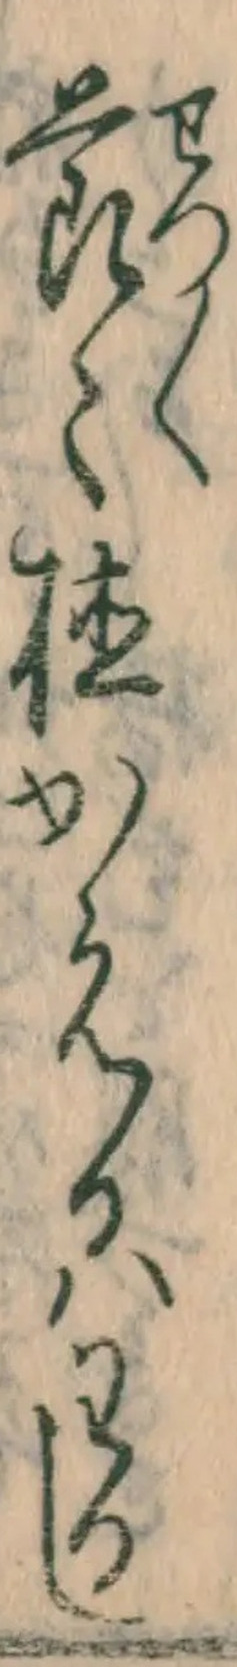節々植かえるはわるし
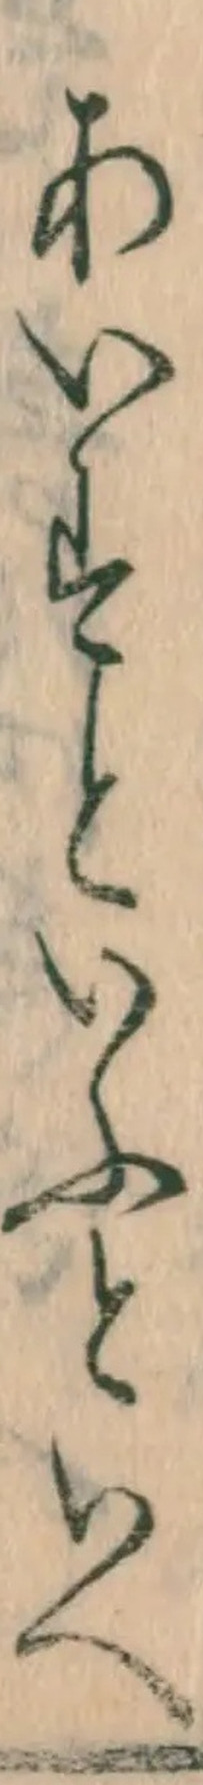あいすといふといへ
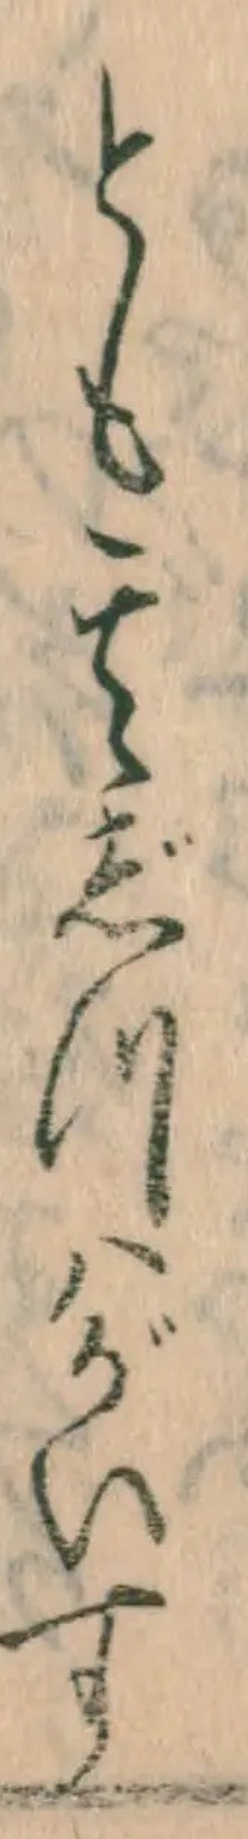とも其じつはがいす
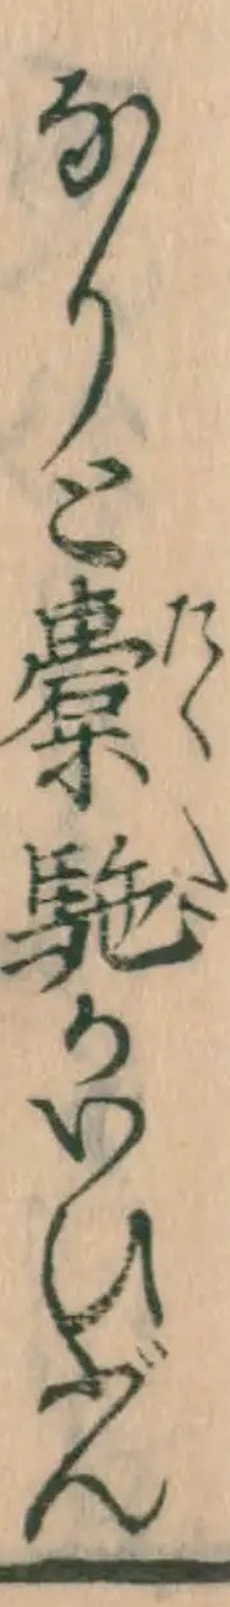なりと橐駝かいひぶん
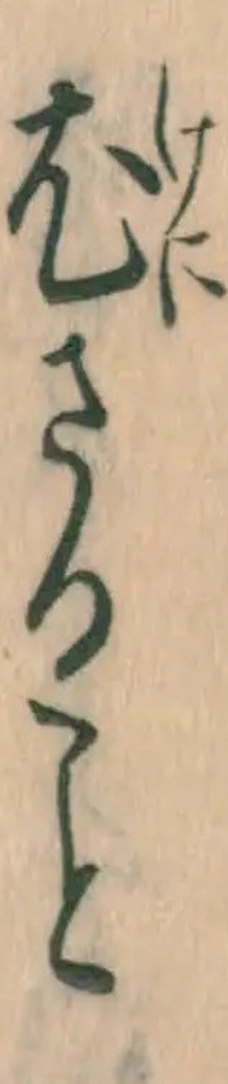尤さること
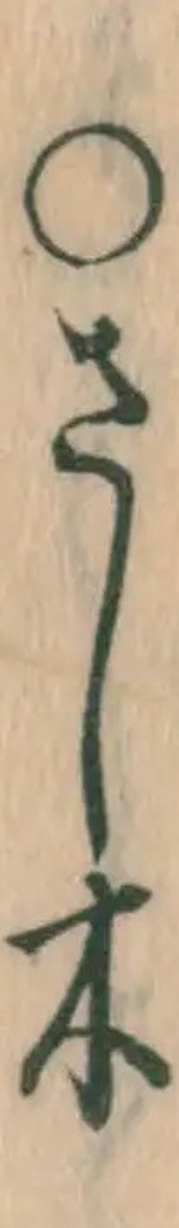○さし木
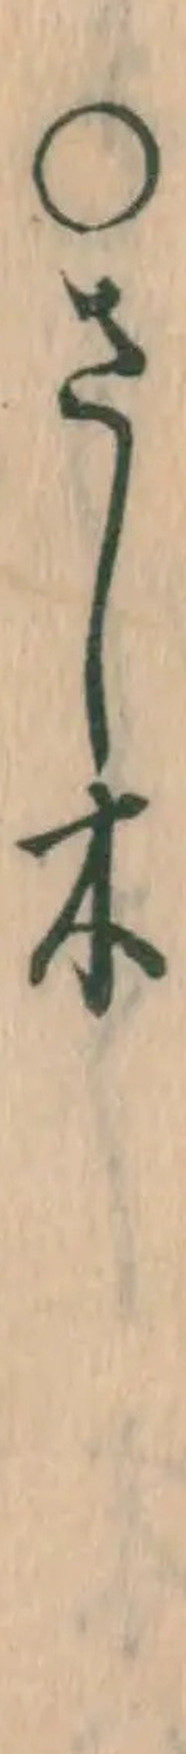○さし木
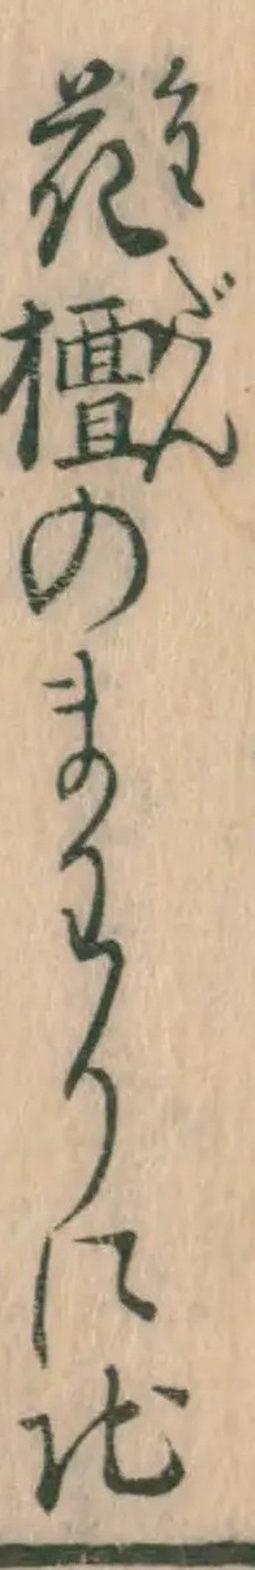花檀のまわりに地
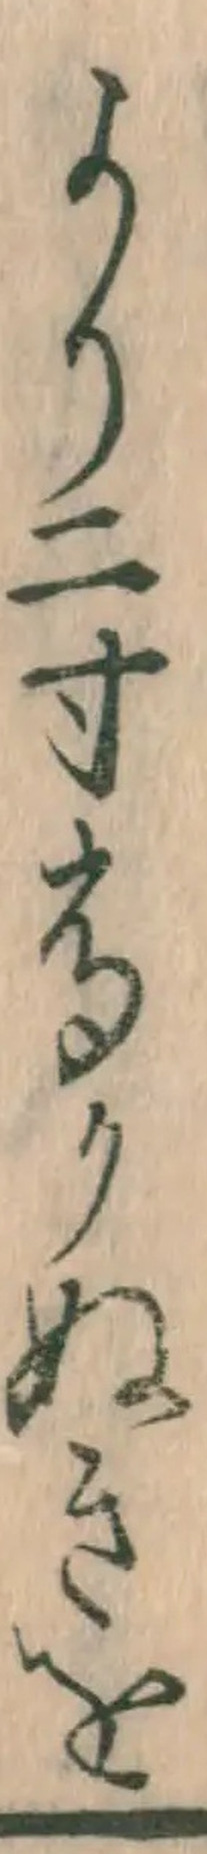より二寸高くぬきを
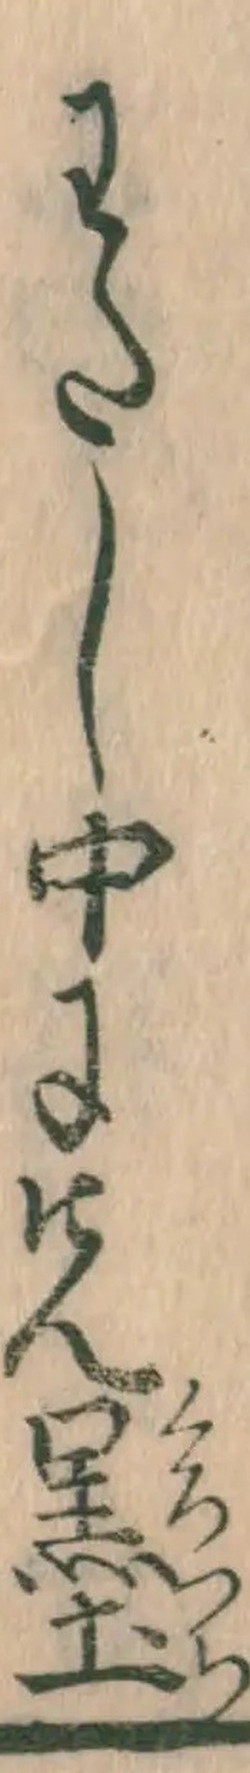わたし中に先黒土
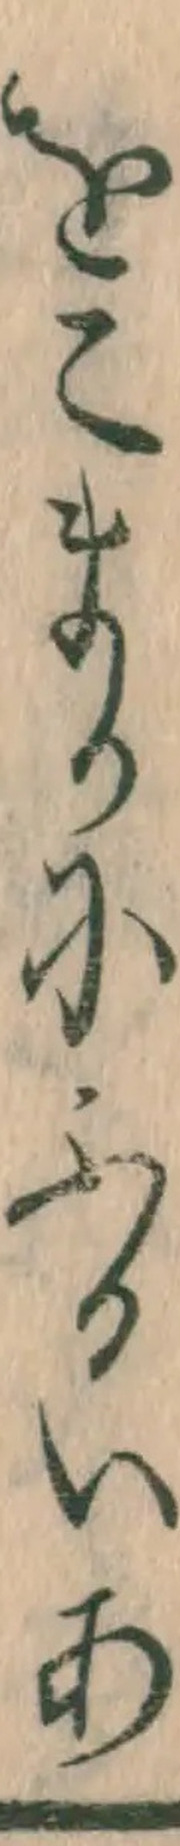をこまかにふるいあ
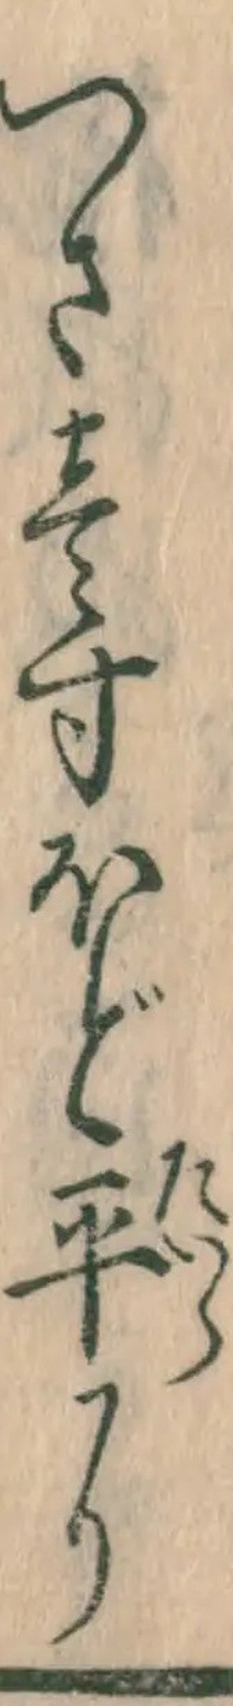つさ壱寸ほど平に
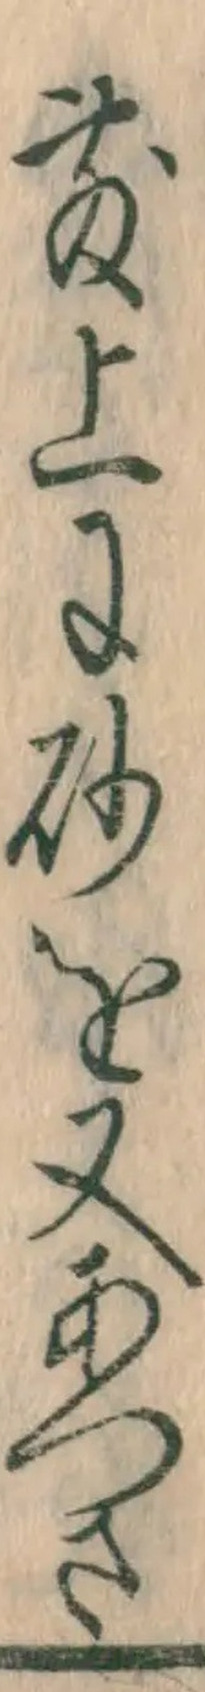敷上に砂を又あつさ
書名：錦繍枕 5巻. [5]
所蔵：国立国会図書館 National Diet Library, JAPAN
